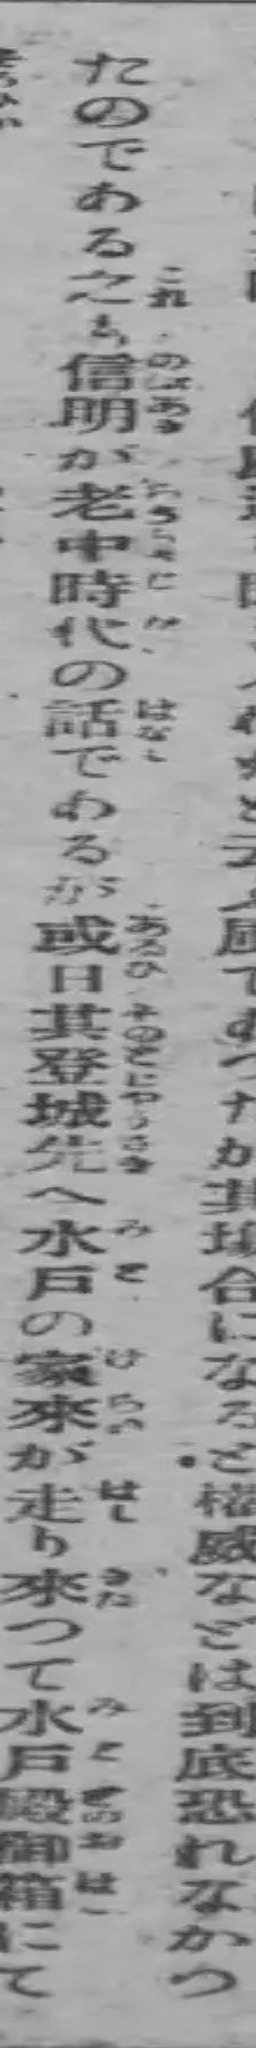たのである之も信明が老中時代の話であるが或日其登城先へ水戸の家来が走り来つて水戸殿御箱にて
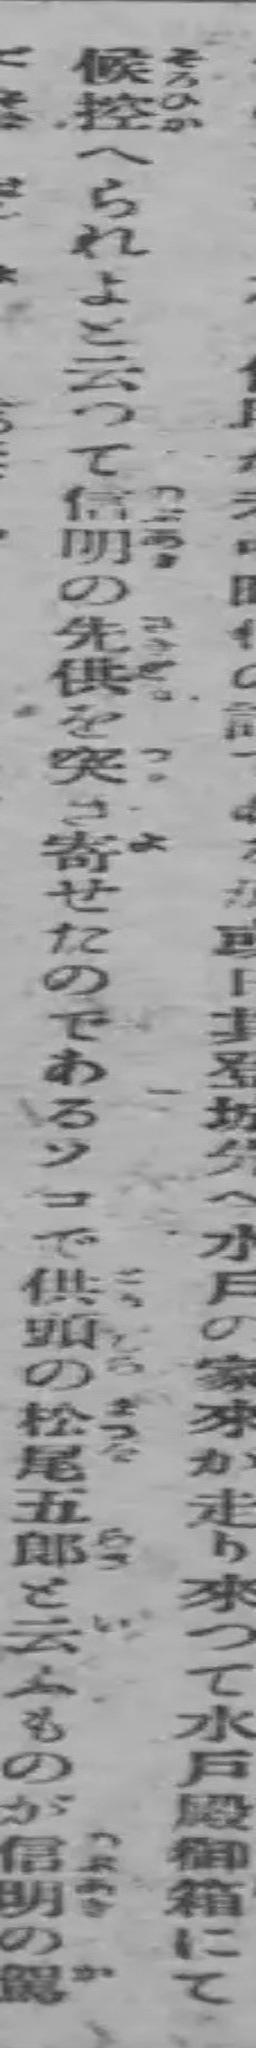候控へられよと云つて信明の先供を突き寄せたのであるソコで供頭の松尾五郎と云ふものが信明の駕
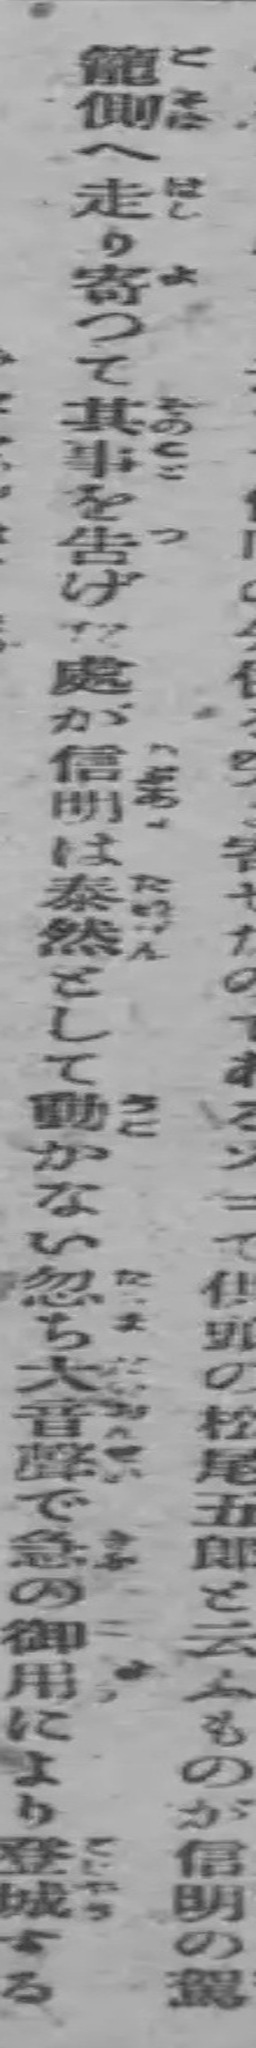籠側へ走り寄つて其事を告げた処が信明は泰然として動かない忽ち大音声で急の御用により登城する
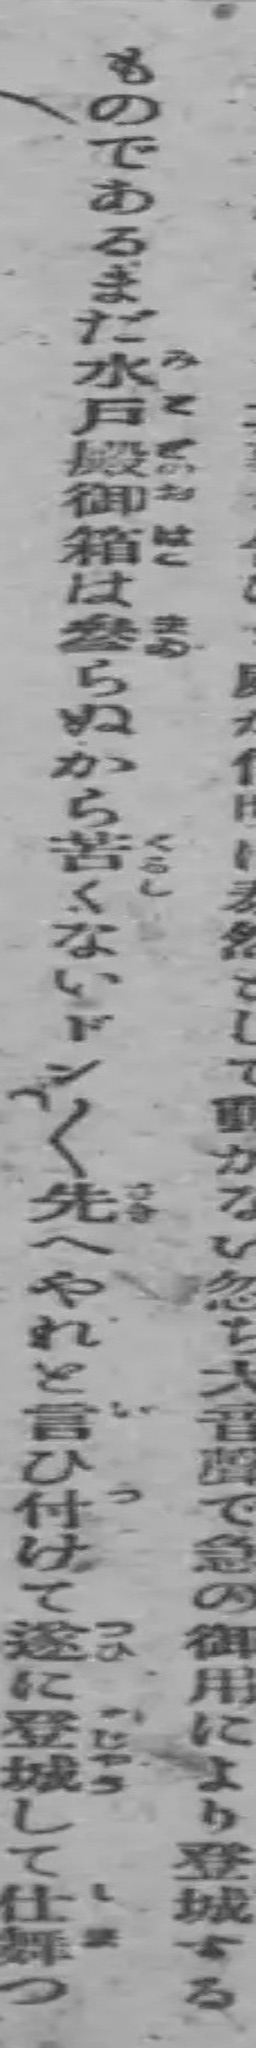ものであるまだ水戸殿御箱は参らぬから苦くないドン〳〵先へやれと言ひ付けて遂に登城して仕舞つ
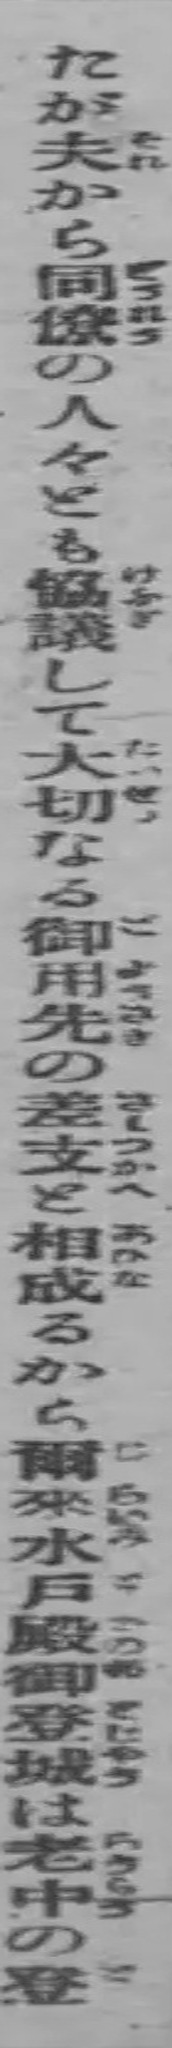たが夫から同僚の人々とも協議して大切なる御用先の差支と相成るから爾来水戸殿御登城は老中の登
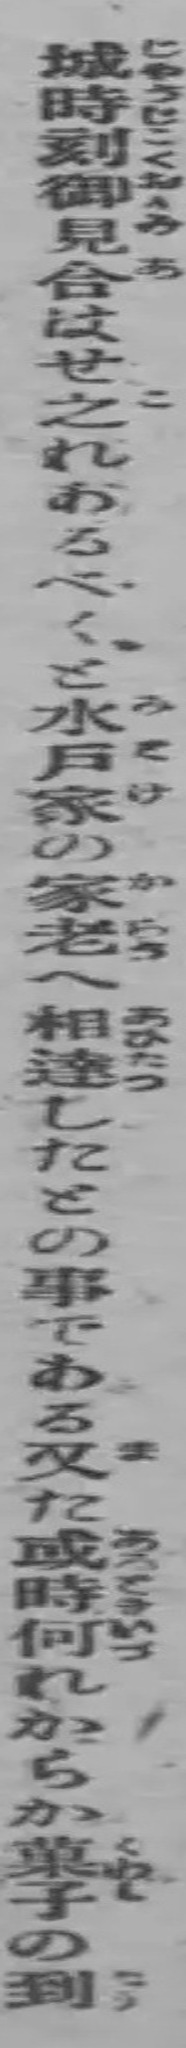城時刻御見合はせ之れあるべくと水戸家の家老へ相達したとの事である又た或時何れからか菓子の到
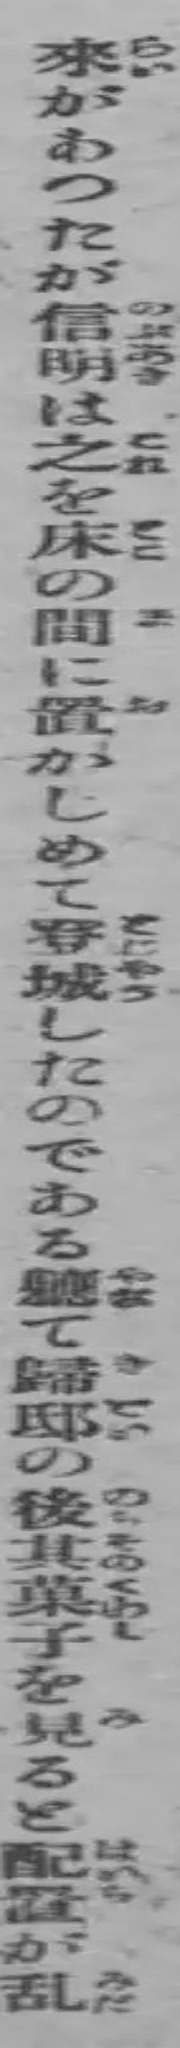来があつたが信明は之を床の間に置かしめて登城したのである軈て帰邸の後其菓子を見ると配置が乱
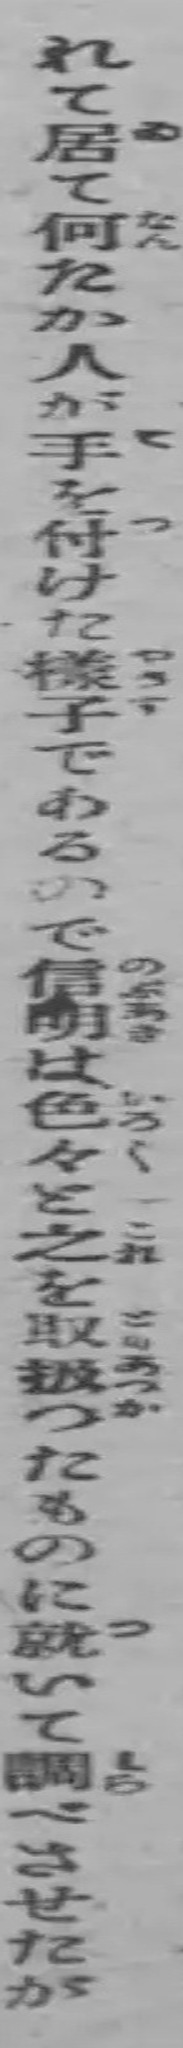れて居て何たか人が手を付けた様子であるので信明は色々と之を取扱つたものに就いて調べさせたが
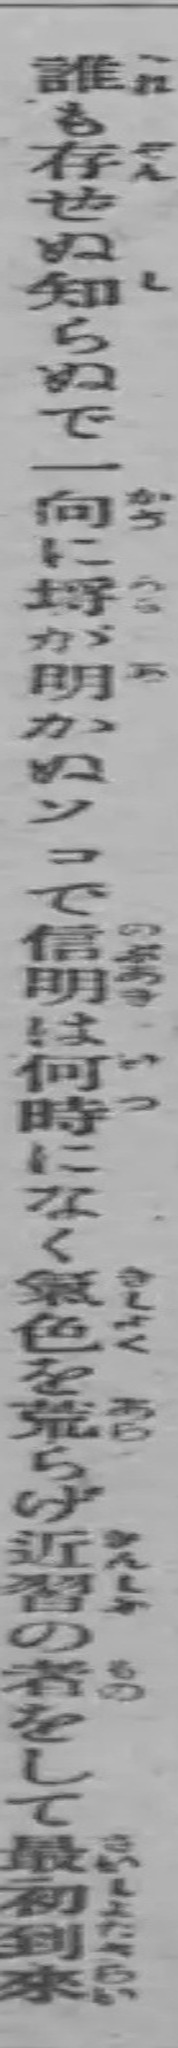誰も存ぜぬ知らぬで一向に埒が明かぬソコで信明は何時になく気色を荒らげ近習の者をして最初到来
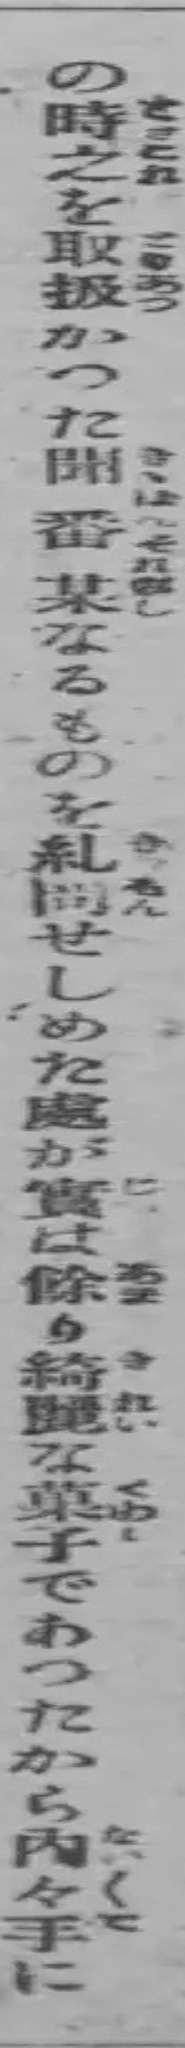の時之を取扱かつた聞番某なるものを糺問せしめた処が実は余り綺麗な菓子であつたから内々手に
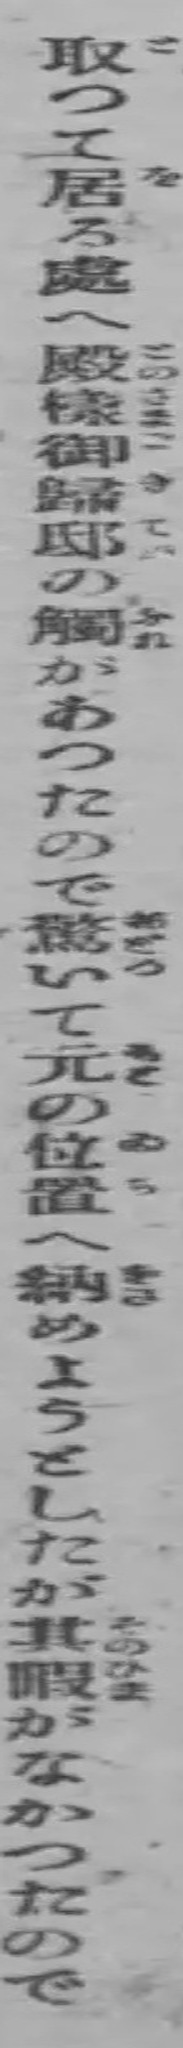取つて居る処へ殿様御帰邸の觸があつたので驚いて元の位置へ納めようとしたが其暇がなかつたので
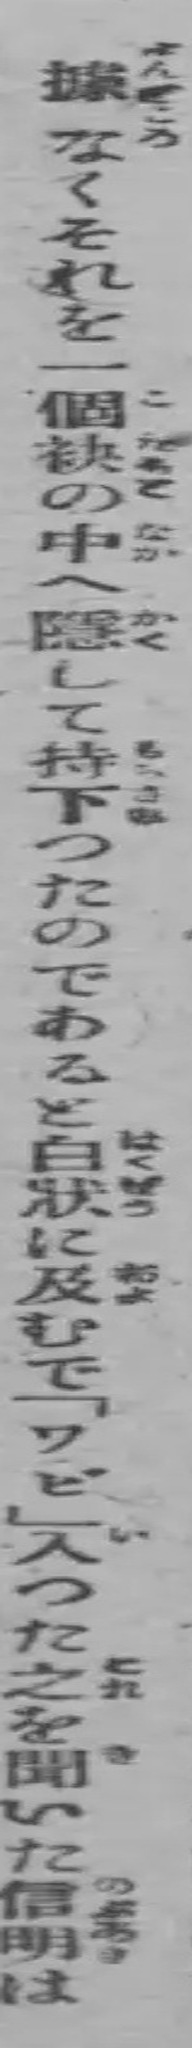拠なくそれを一個袂の中へ隠して持下つたでのあると白状に及むで「ワビ」入つた之を聞いた信明は
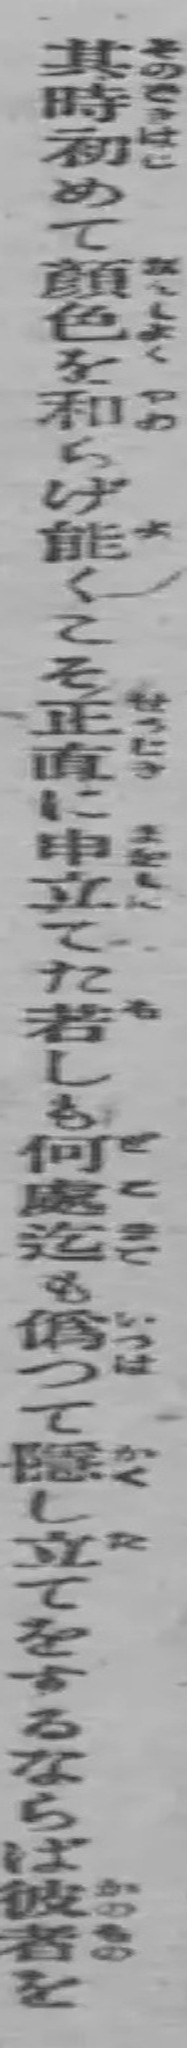其時初めて顔色を和らげ能くこそ正直に申立てた若しも何処迄も偽つて隠し立てをするならば彼者を
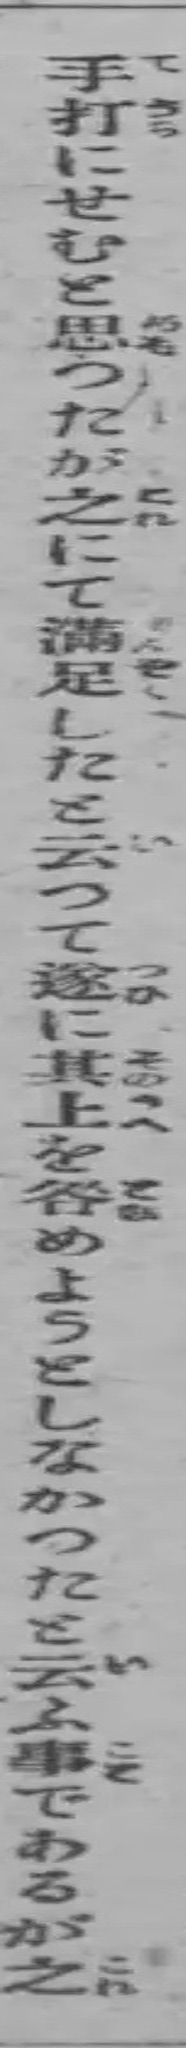手打にせむと思つたが之にて満足したと云つて遂に其上を咎めようとしなかつたと云ふ事であるが之
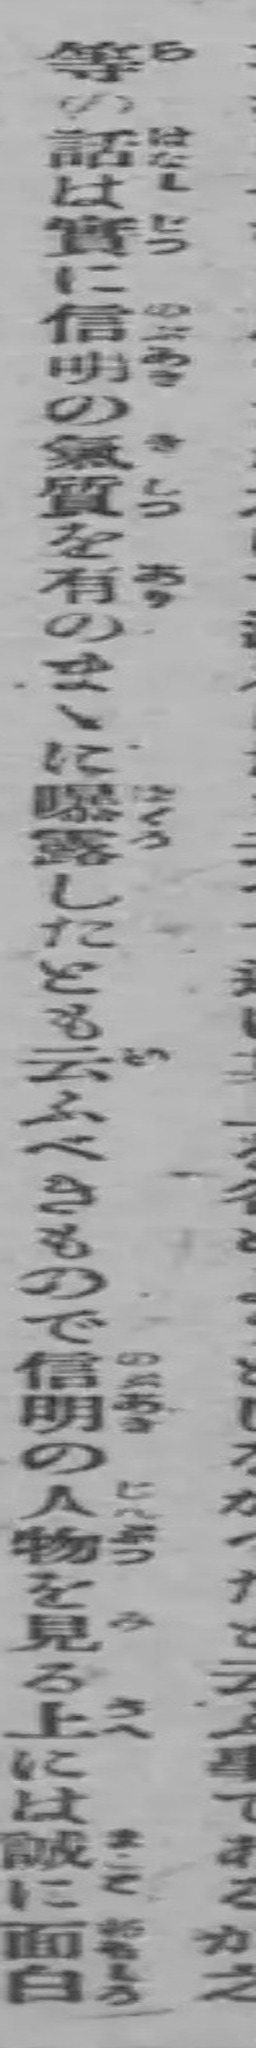等の話は実に信明の気質を有のまゝに曝露したとも云ふべきもので信明の人物を見る上には誠に面白
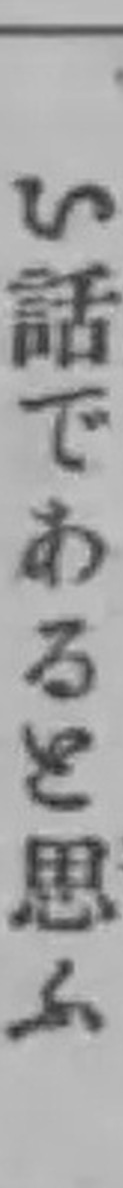い話であると思ふ
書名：豊橋市史談
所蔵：国立国会図書館 National Diet Library, JAPAN
